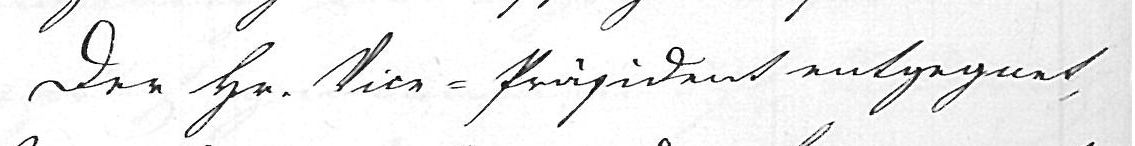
Der Hr. Vice-Präsident entgegnet,
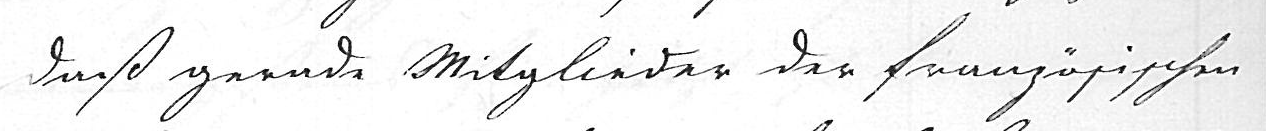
daß gerade Mitglieder der französischen
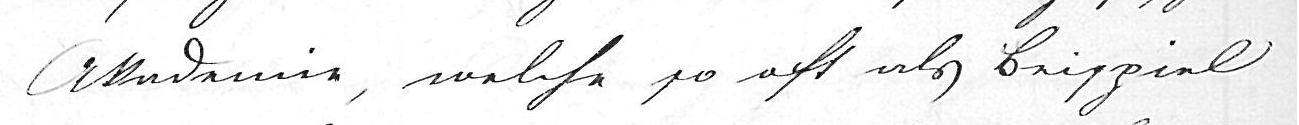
Akademie, welche so oft als Beispiel
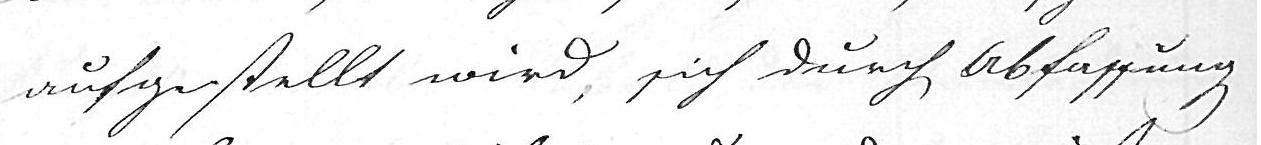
aufgestellt wird, sich durch Abfassung
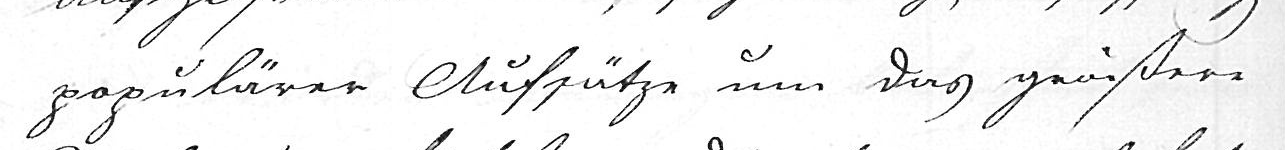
populärer Aufsätze um das größere
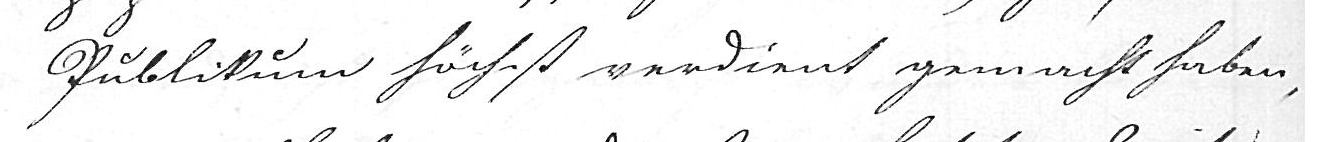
Publikum höchst verdient gemacht haben,
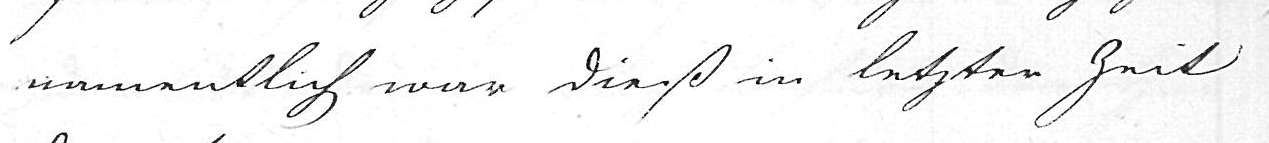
namentlich war dieß in letzter Zeit
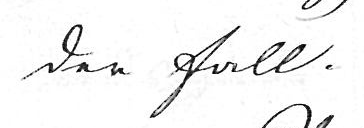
der Fall.
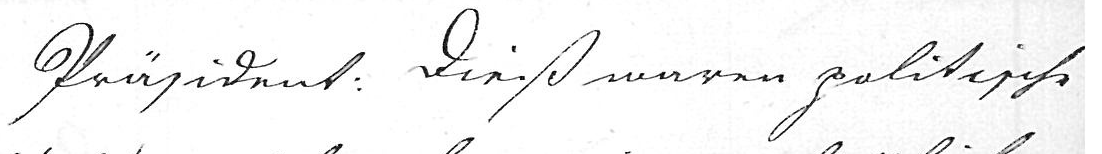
Präsident: Dieß waren politische
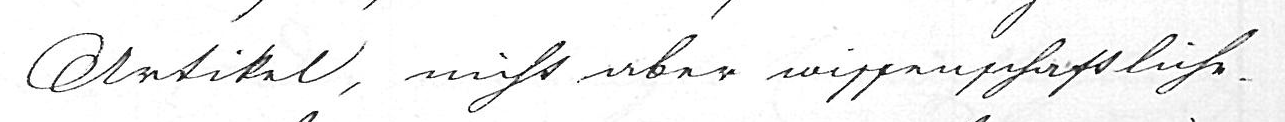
Artikel, nicht aber wissenschaftliche.
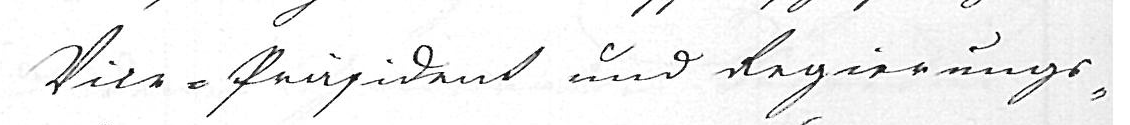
Vice-Präsident und Regierungs-
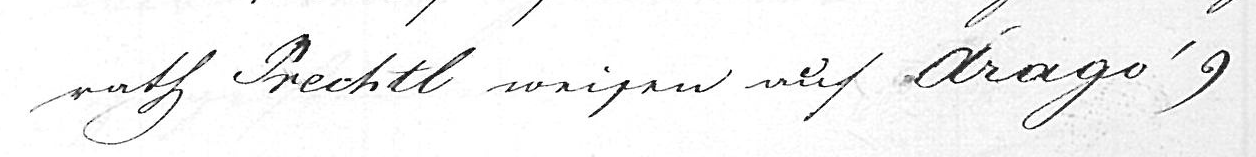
rath Prechtl weisen auf Arago's
